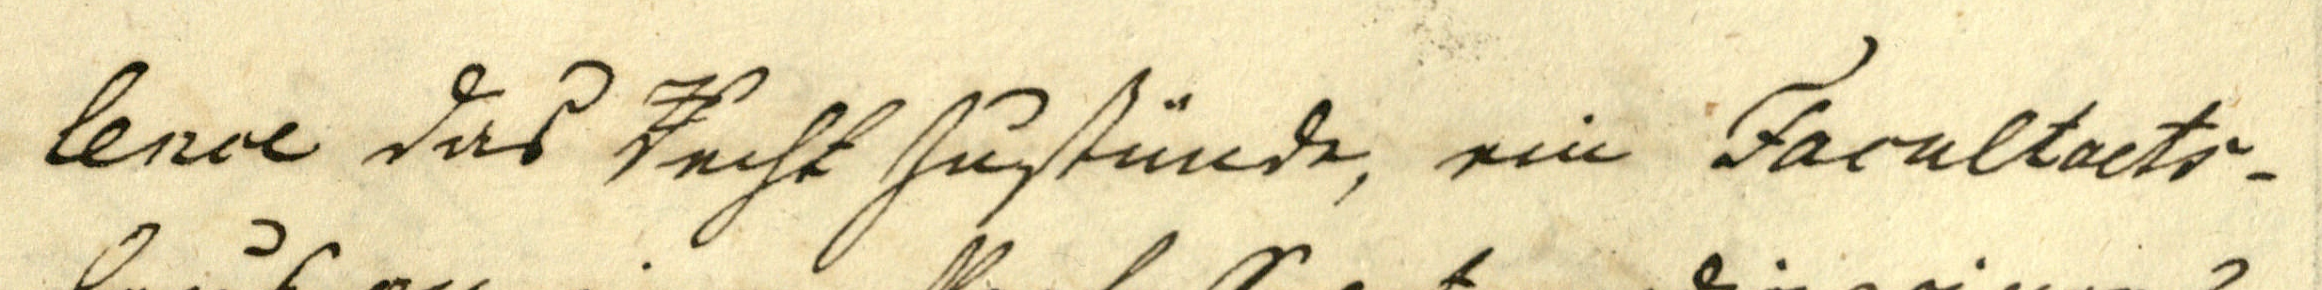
lence das Recht zustünde, ein Facultaets¬
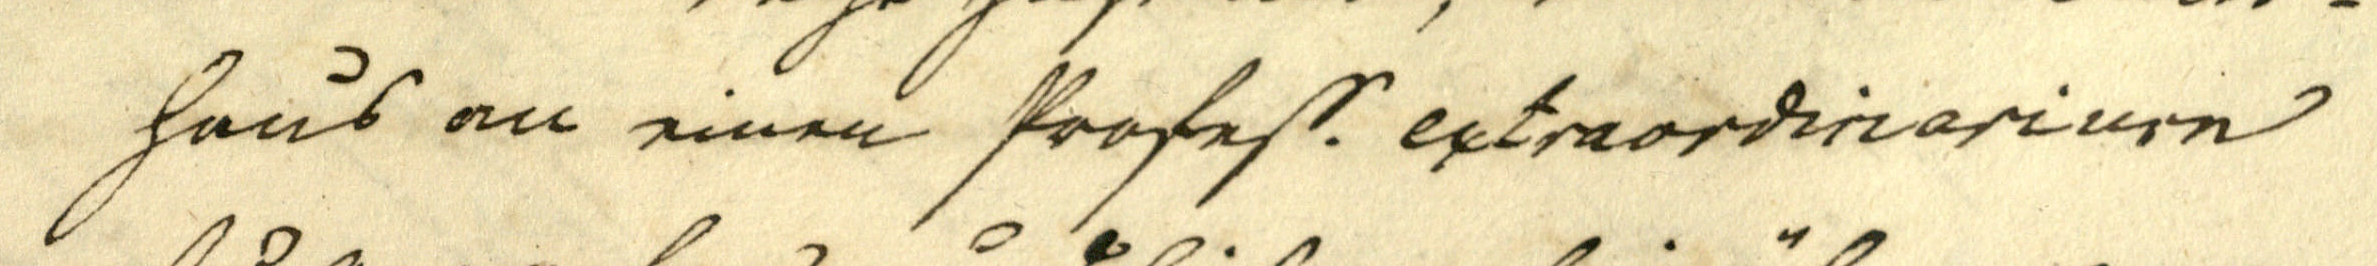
Haus an einen Profess. extraordinarium
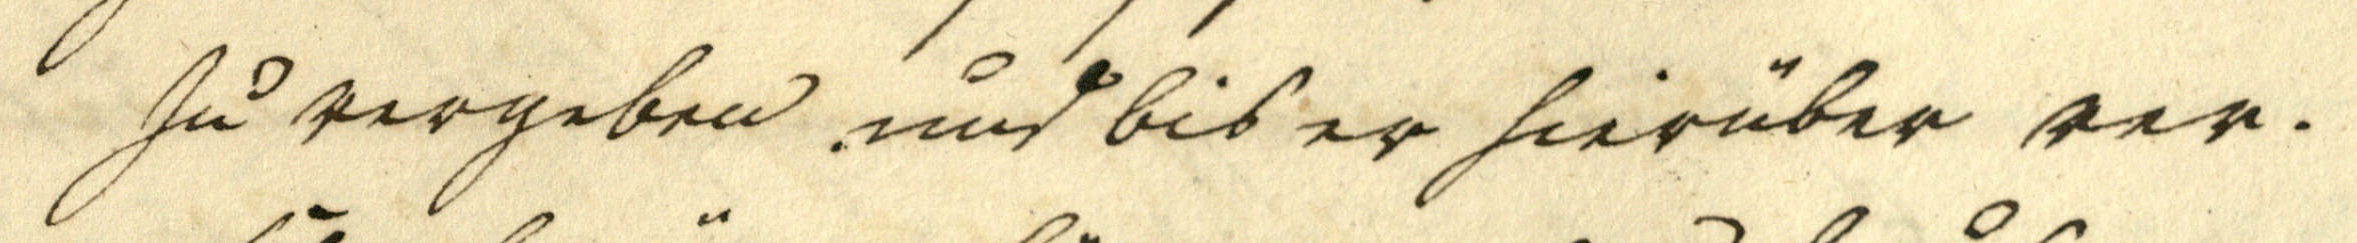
zu vergeben und bis er hierüber ver¬
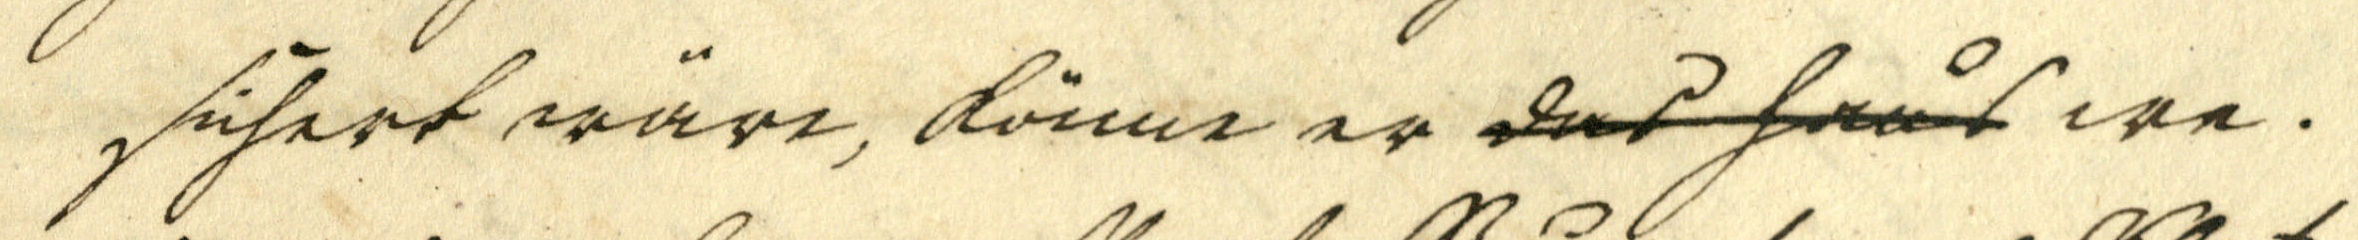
sichert wäre, könne er das haus we¬
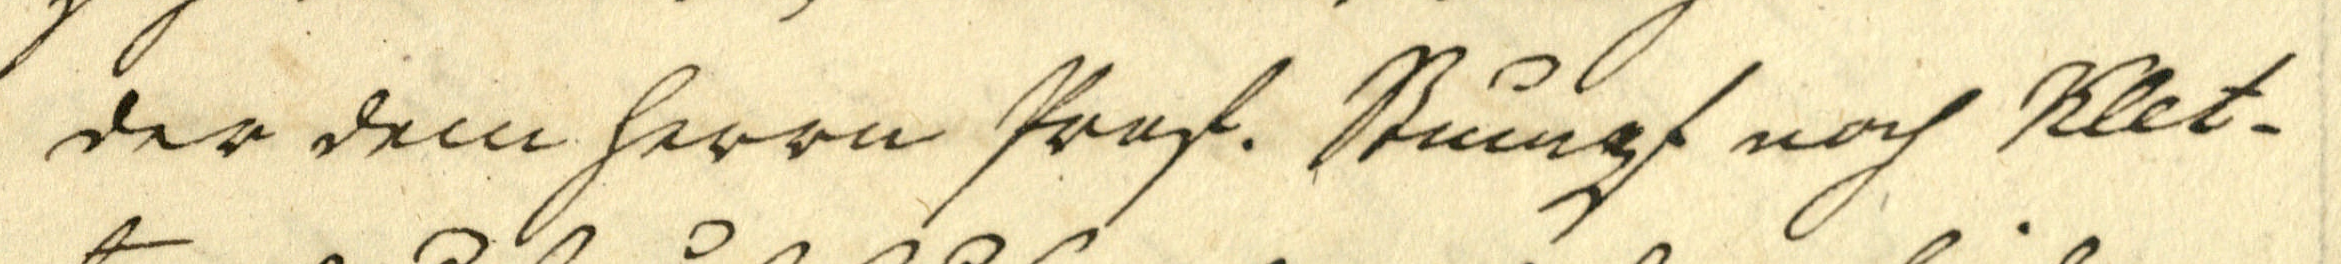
der dem Herrn Prof. Stumpf noch Klet¬
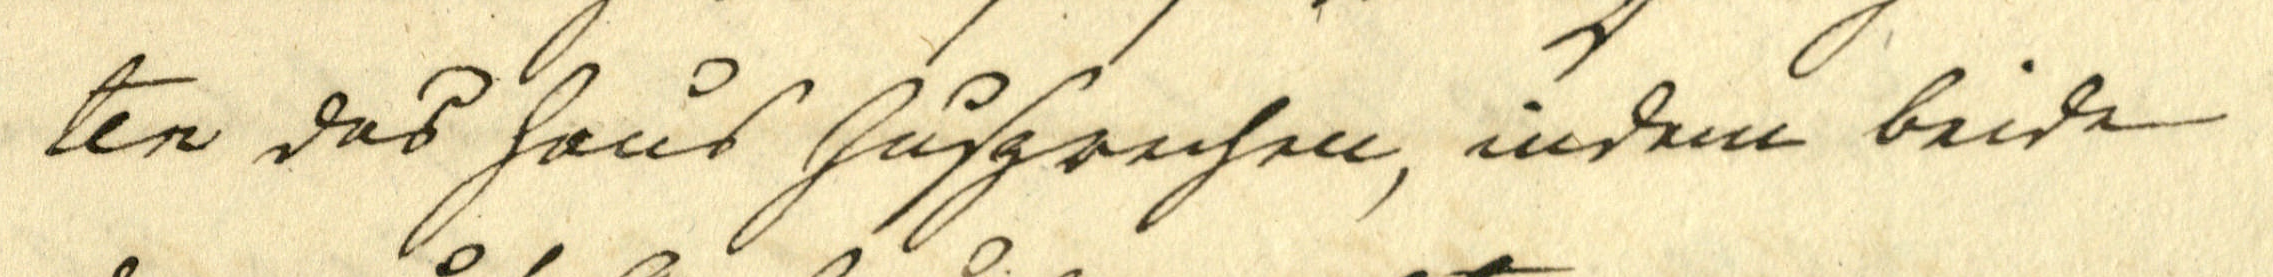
ten das Haus zusprechen, indem beide
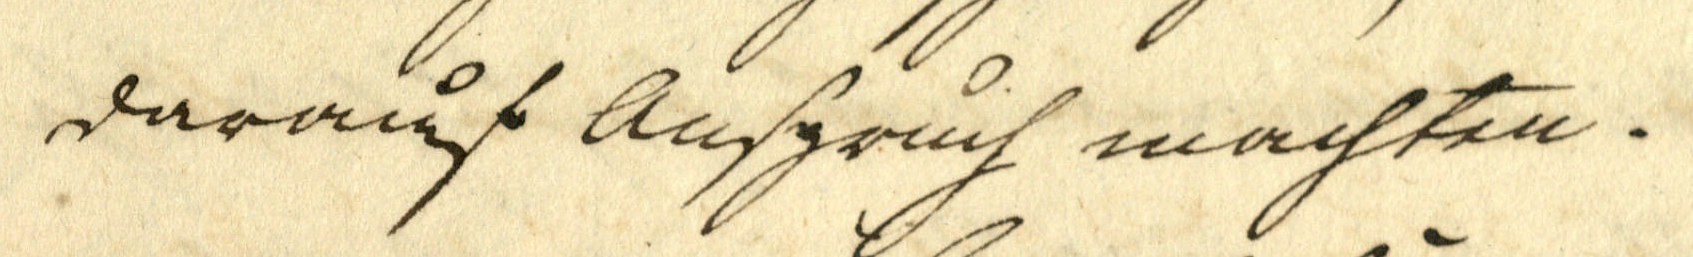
darauf Anspruch machten.
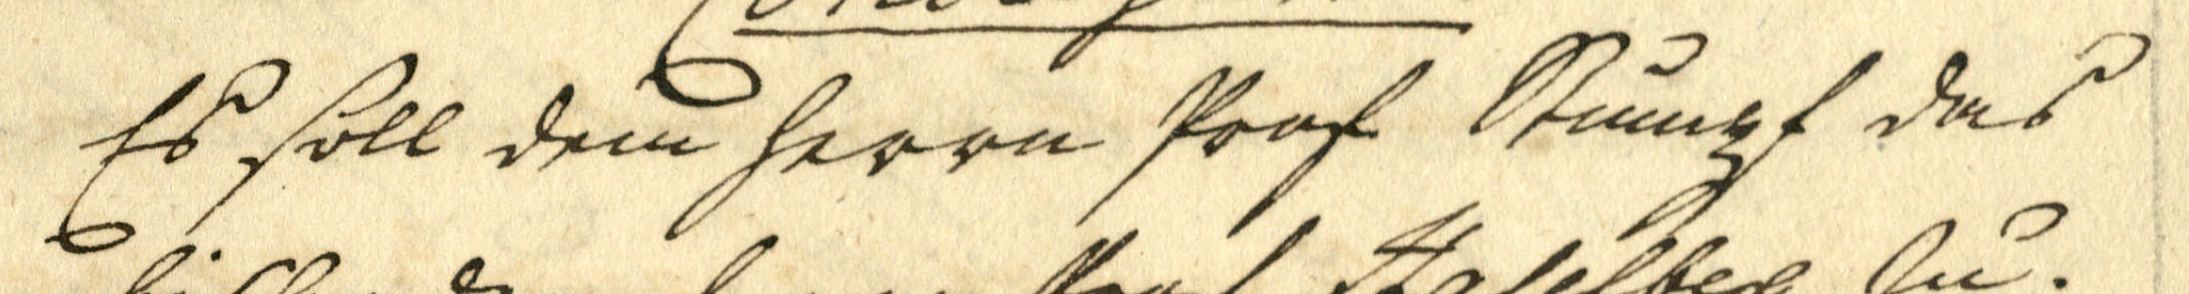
Es soll dem Herrn Prof. Stumpf das
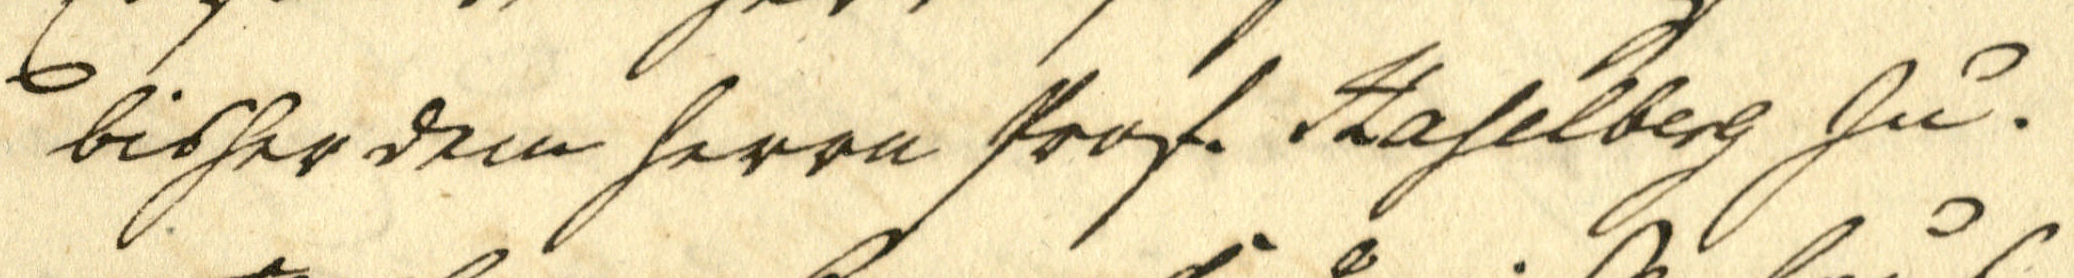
bisher dem Herrn Prof. Haselberg zu¬
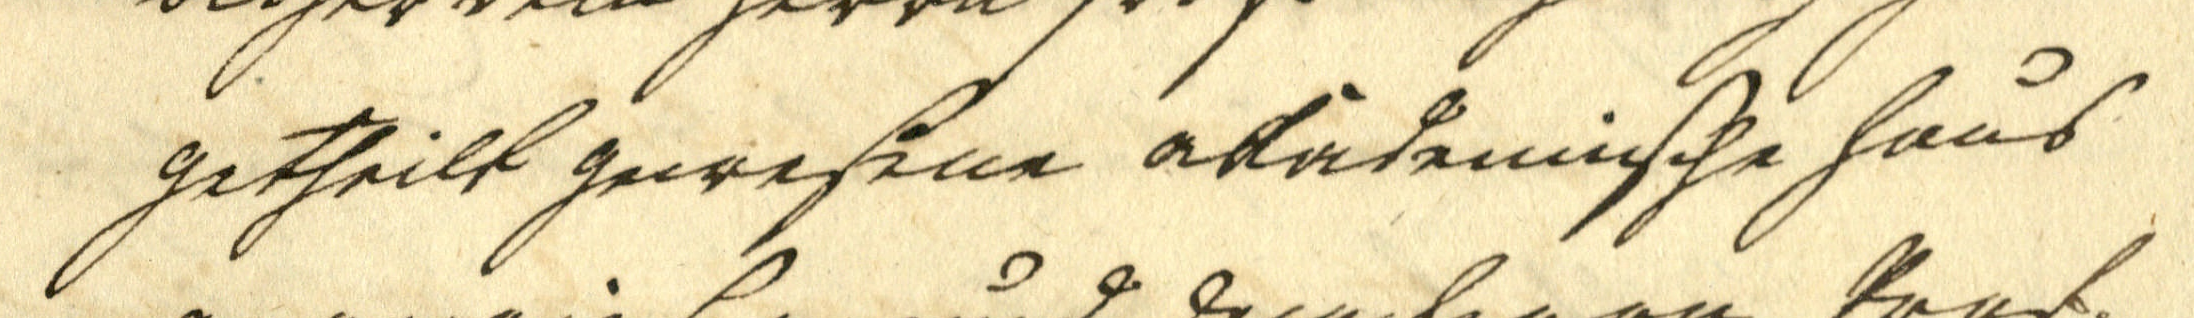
getheilt gewesene akademische Haus
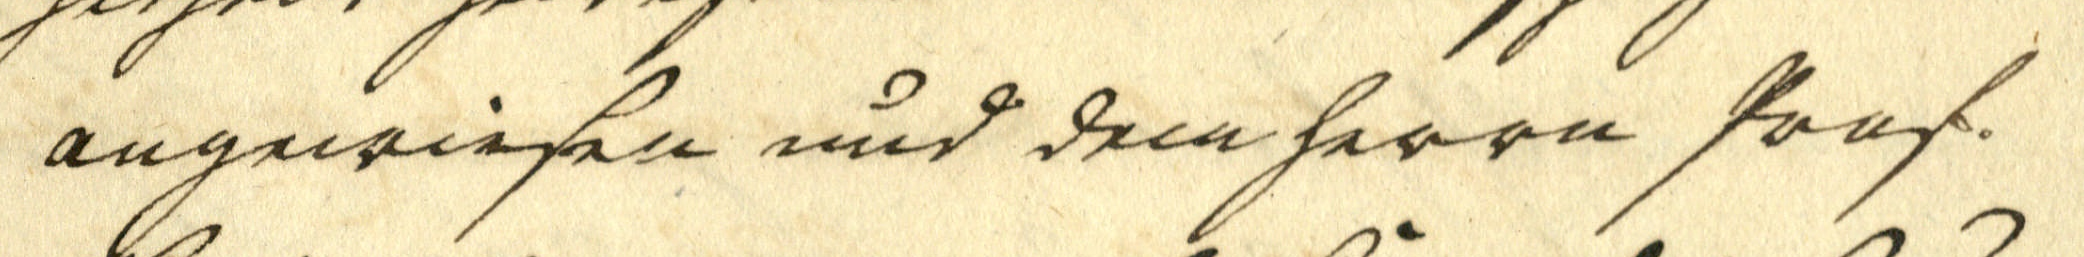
angewiesen und dem Herrn Prof.
